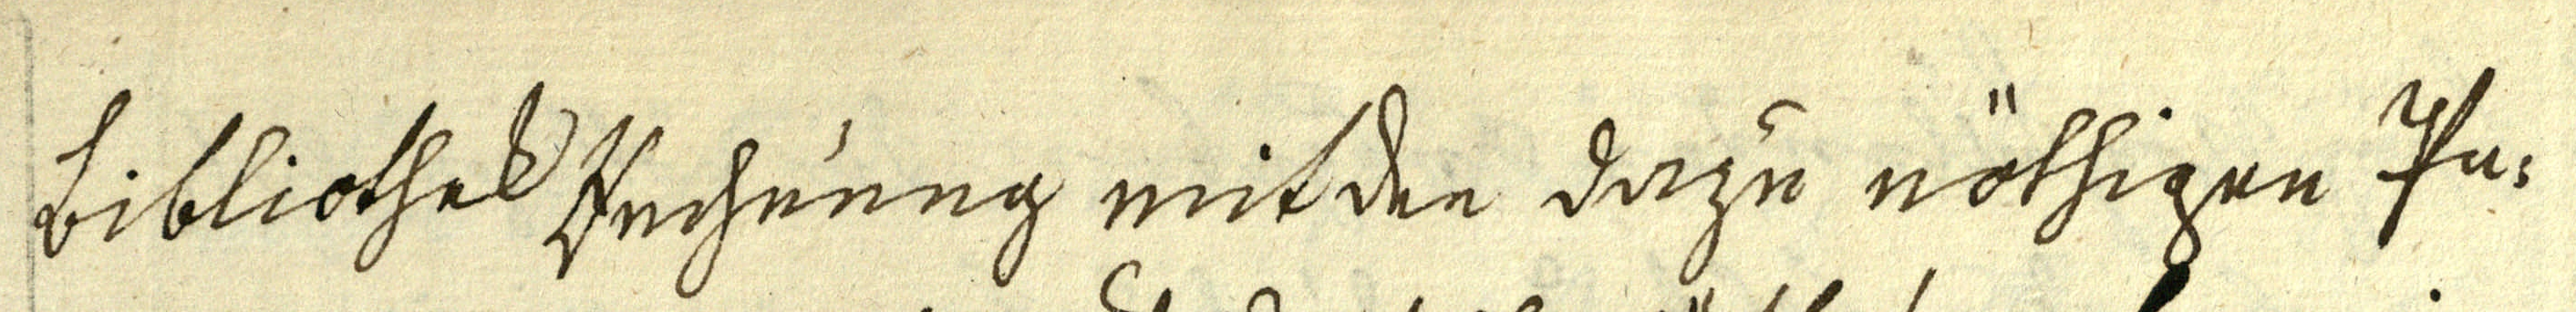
Bibliothek Rechnung mit den dazu nöthigen Pa¬
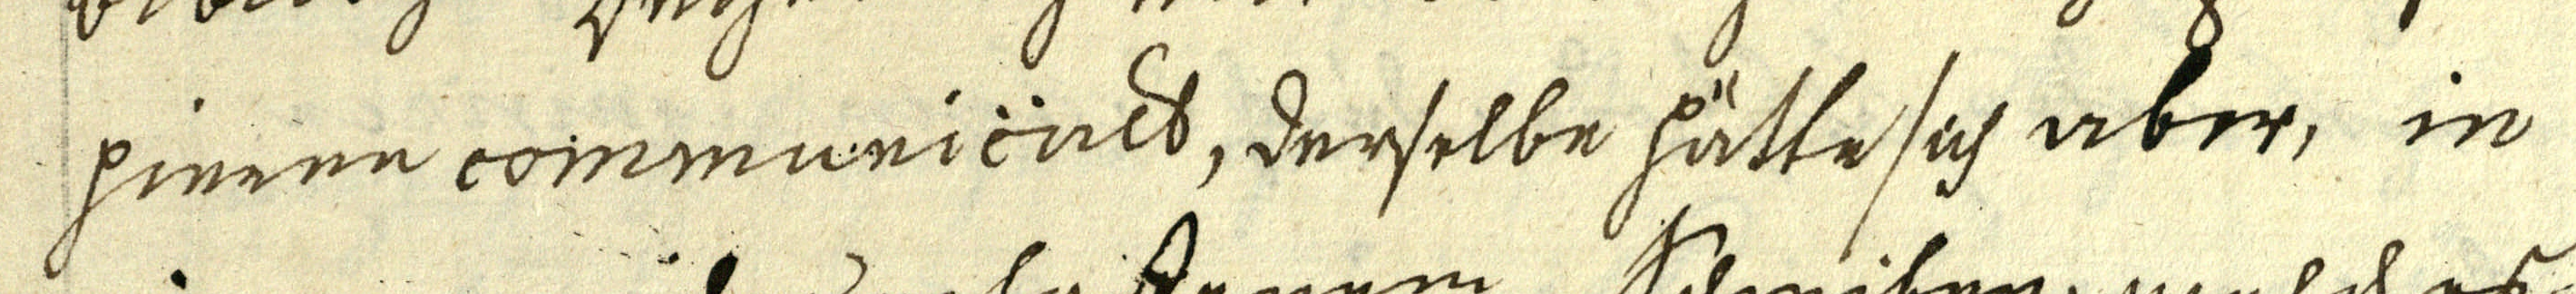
pieren communiciret, derselbe hätte sich aber, in
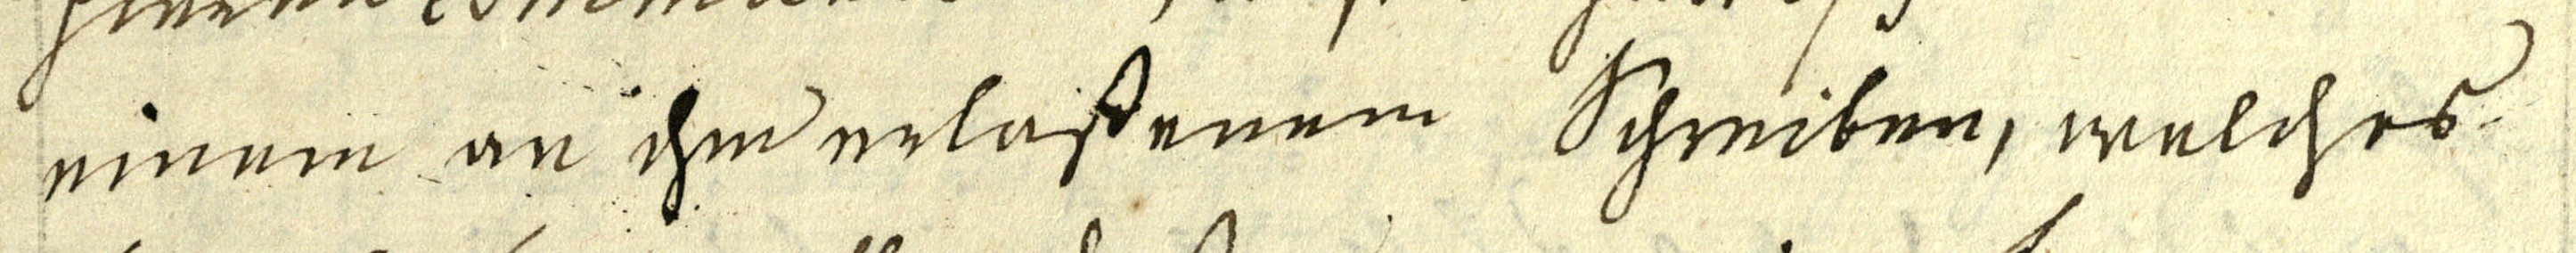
einem an ihm erlaßenen Schreiben, welches
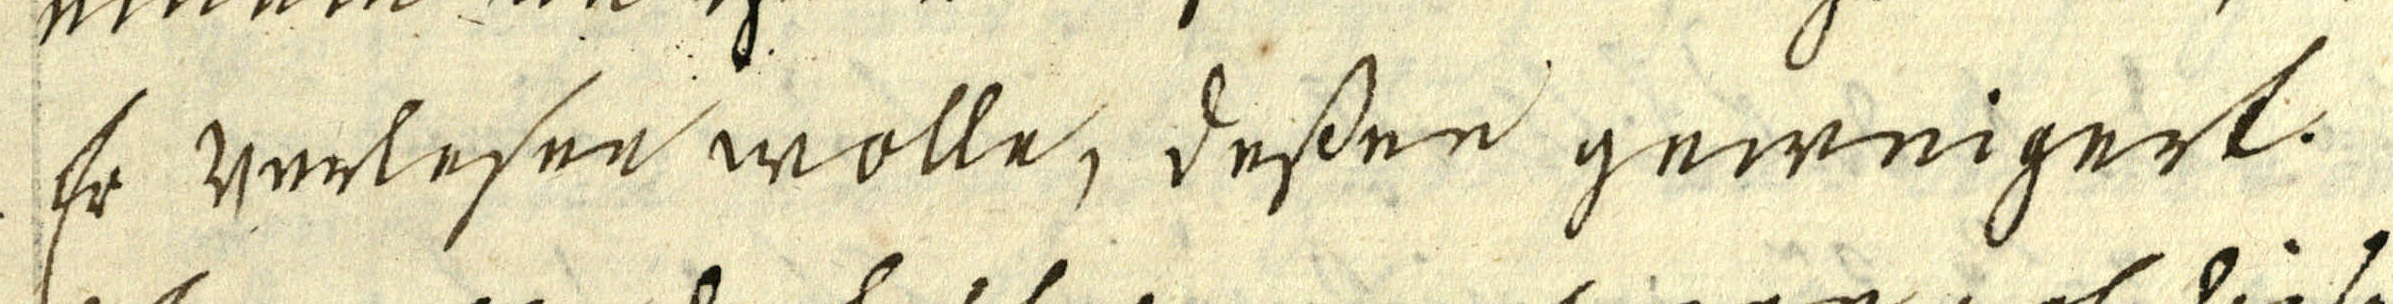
Er verlesen wolle, deßen geweigert.
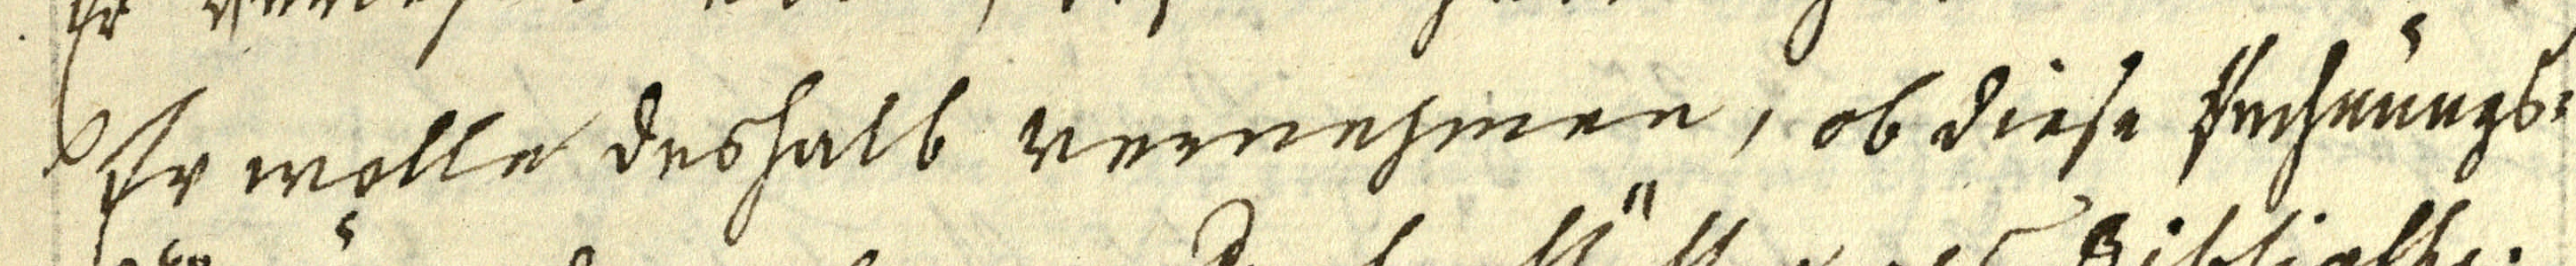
Er wolle deshalb vernehmen, ob diese Rechnungs
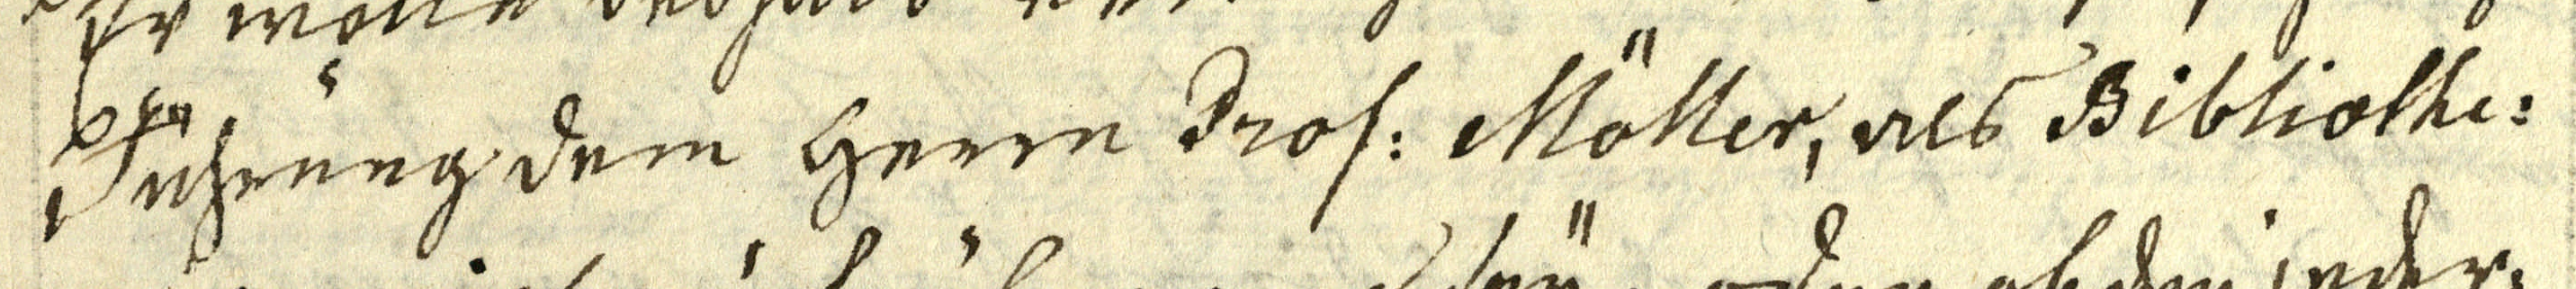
Führung dem Herrn Prof. Möller, als Bibliothe¬
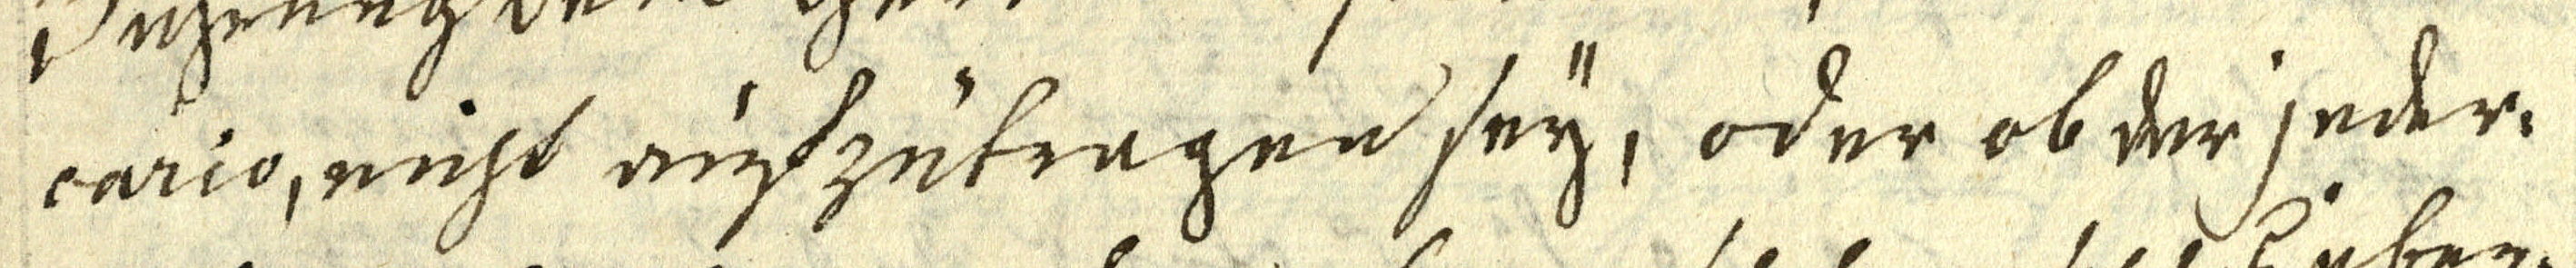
cario, nicht aufzutragen seÿ, oder ob der jeder¬
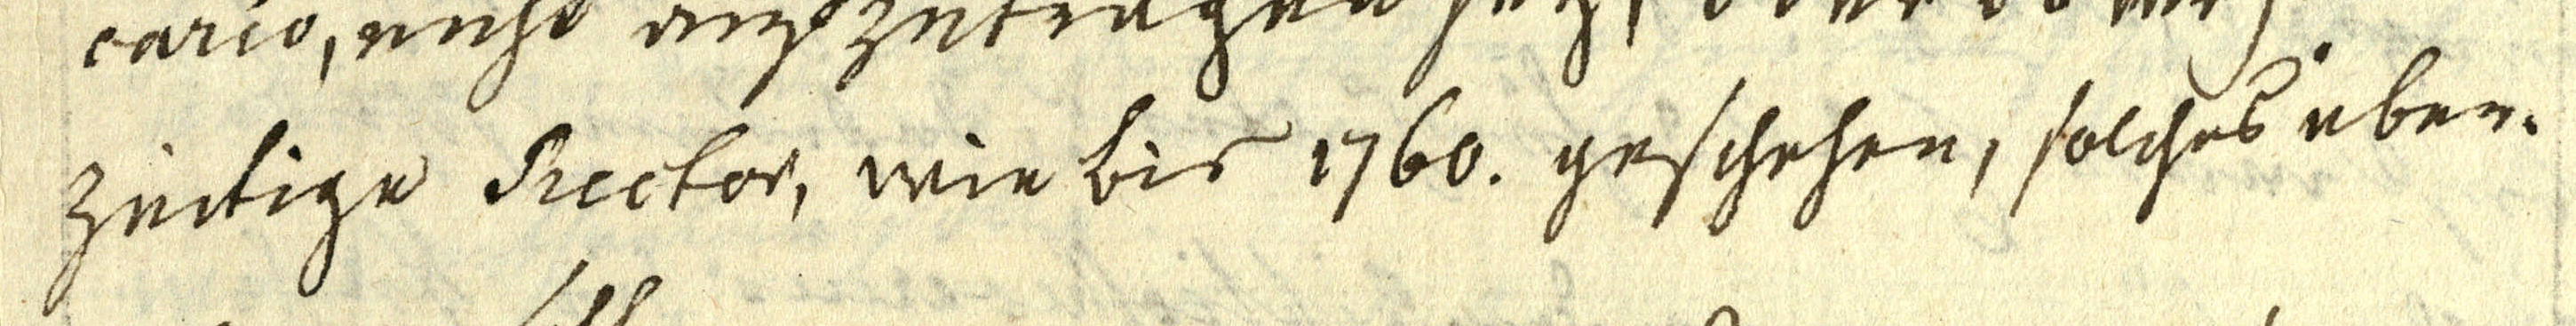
zeitige Rector, wie bis 1760. geschehen, solches über¬
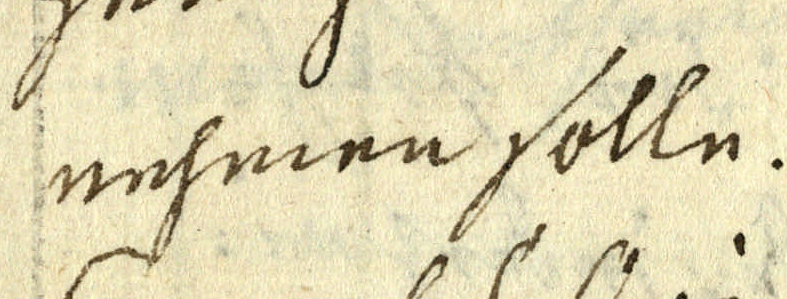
nehmen solle.
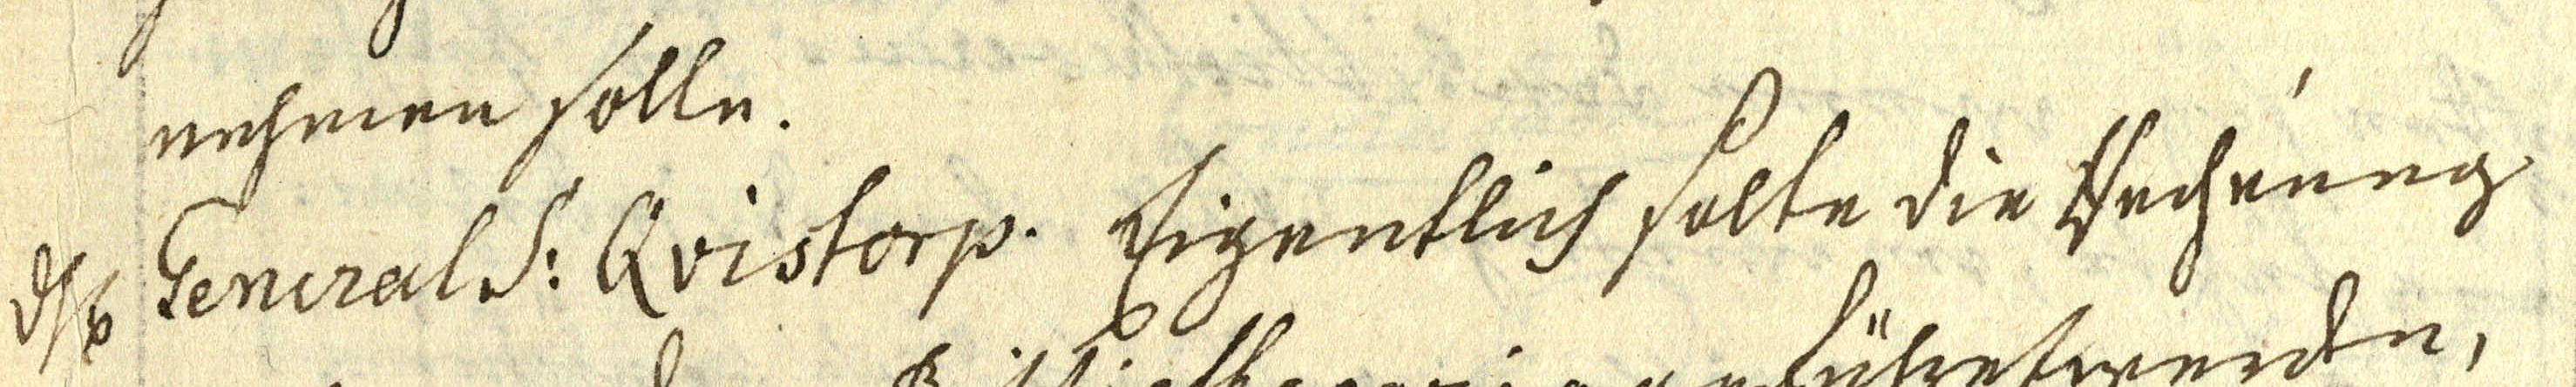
dh GeneralS. Quistorp Eigentlich solte die Rechnung
